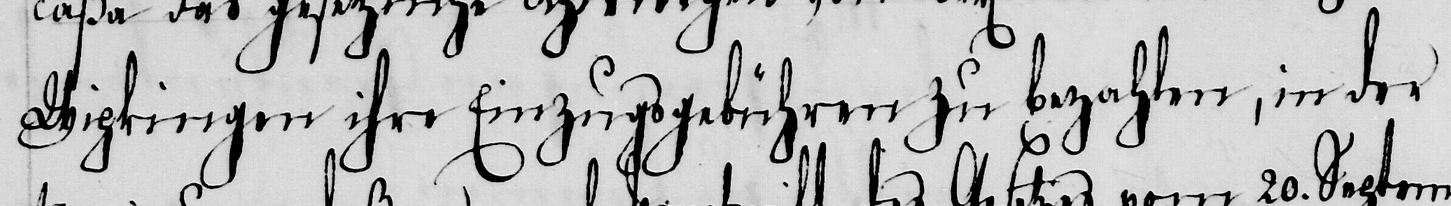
Wipkingen ihre Einzugsgebühren zu bezahlen, in der
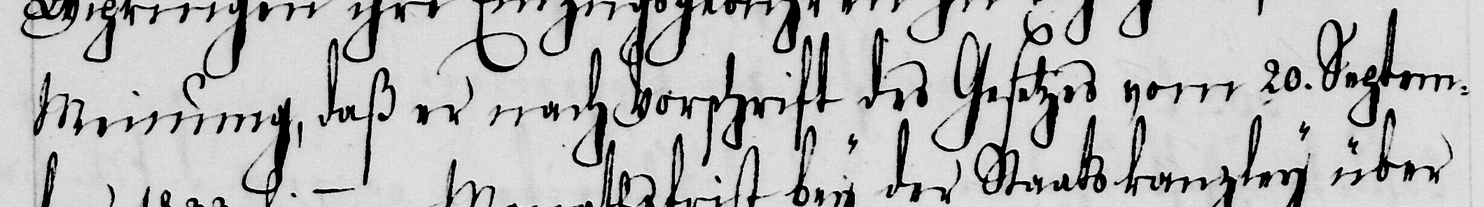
Meinung, daß er nach Vorschrift des Gesetzes vom 20. Septem¬
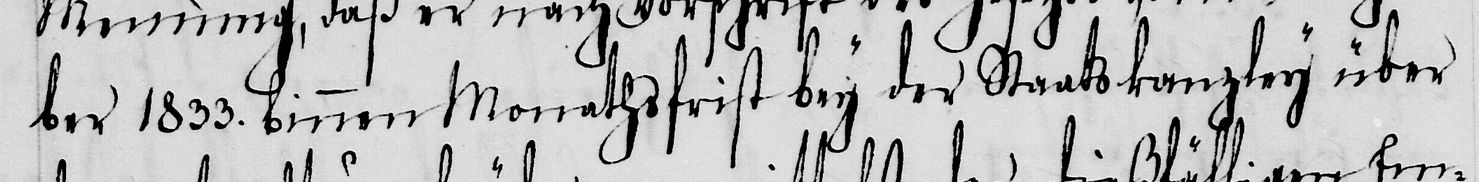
ber 1833. binnen Monathsfrist bey der Staatskanzley über
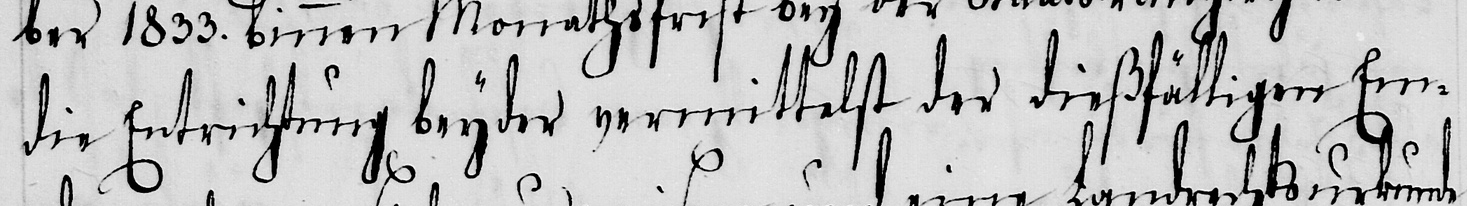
die Entrichtung beyder vermittelst der dießfälligen Em¬
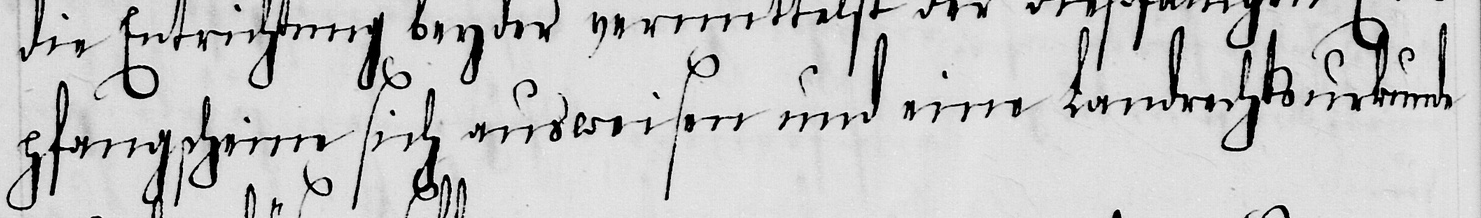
pfangscheine sich ausweisen und eine Landrechtsurkunde
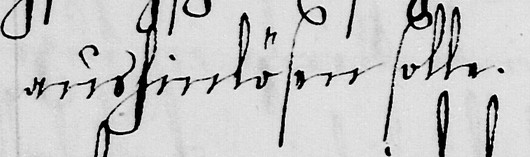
aushinlösen solle.
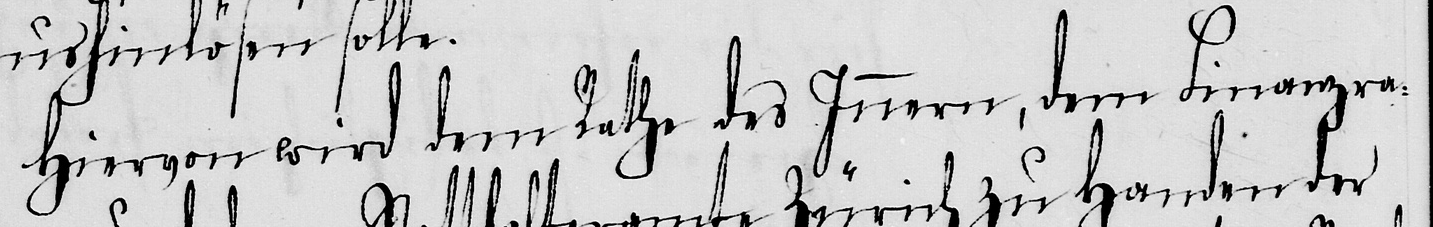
Hiervon wird dem Rathe des Innern, dem Finanzra¬
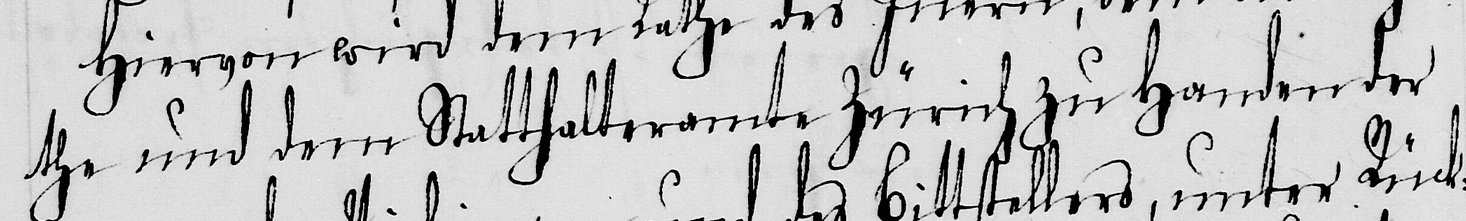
the und dem Statthalteramte Zürich zu Handen der
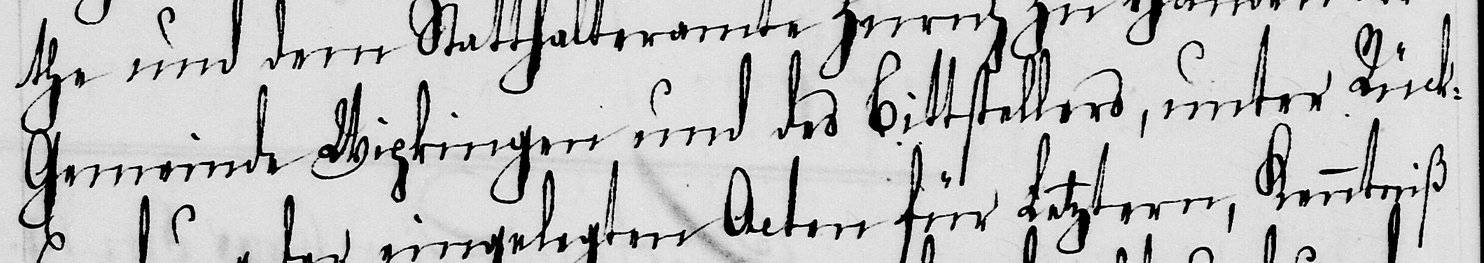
Gemeinde Wipkingen und des Bittstellers, unter Rück¬
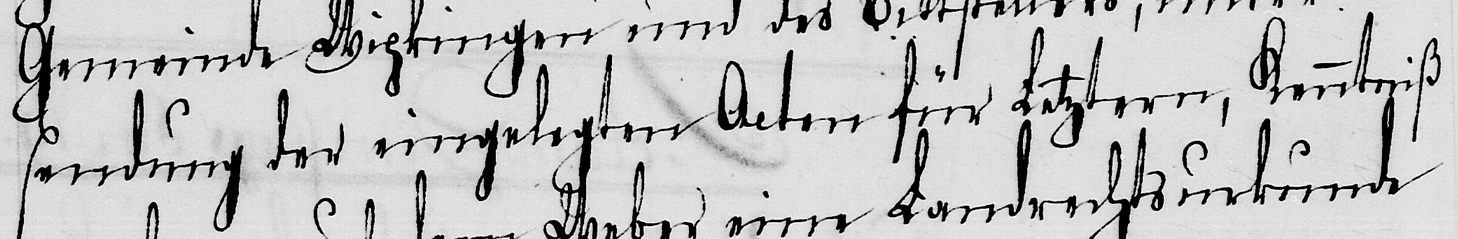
sendung der eingelegten Acten für Letztern, Kenntniß
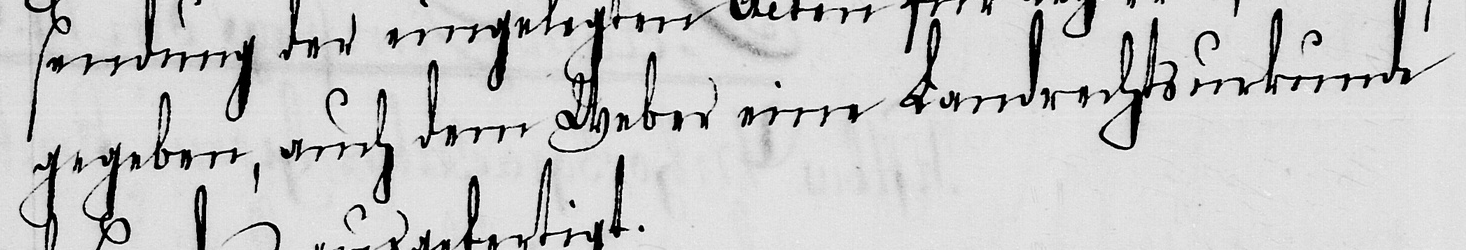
gegeben, auch dem Weber eine Landrechtsurkunde
